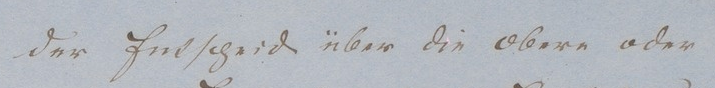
der Entscheid über die obere oder
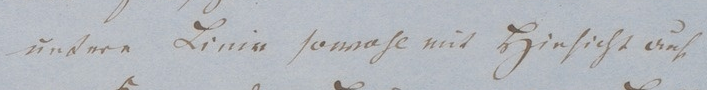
untere Linie sowohl mit Hinsicht auf
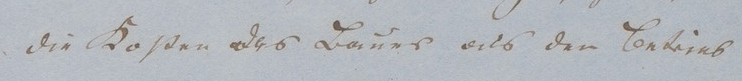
die Kosten des Baues als den Betrieb
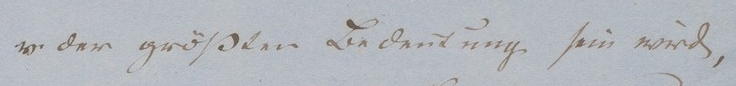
v. der größten Bedeutung sein wird,
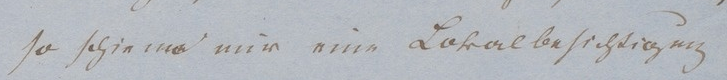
so schiene mir eine Lokalbesichtigung
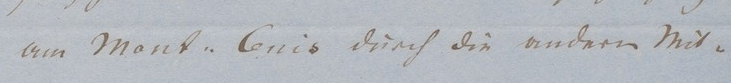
am Mont–Cenis durch die andern Mit-
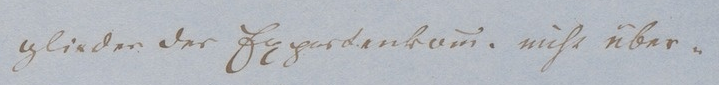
glieder der Expertenkomm. nicht über-
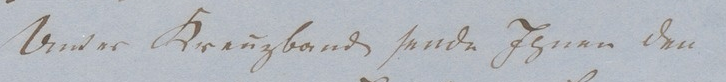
Unter Kreuzband sende Ihnen den
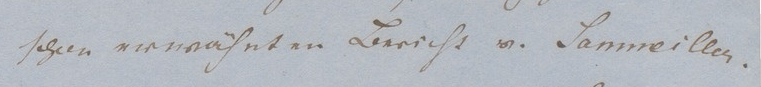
schon erwähnten Bericht v. Sommeiller.
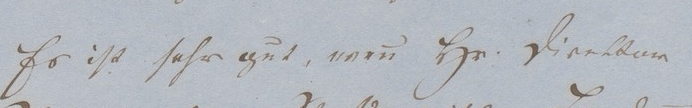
Es ist sehr gut, wenn Hr. Direktor
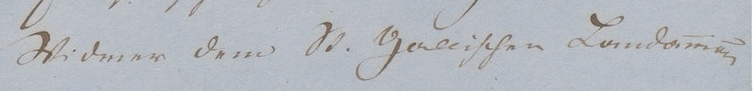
Widmer dem St. Gallischen Landammann
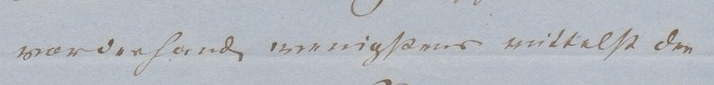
vorderhand wenigstens mittelst der
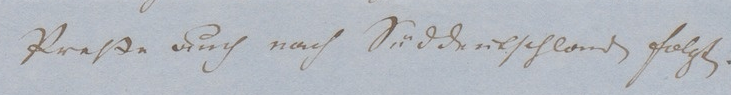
Preße auch nach Süddeutschland folgt.
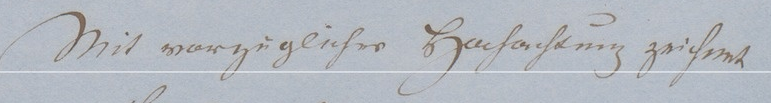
Mit vorzüglicher Hochachtung zeichnet
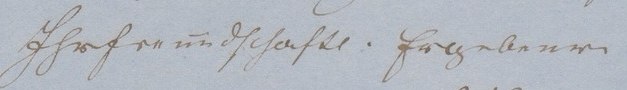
Ihr freundschaftl. Ergebenr
